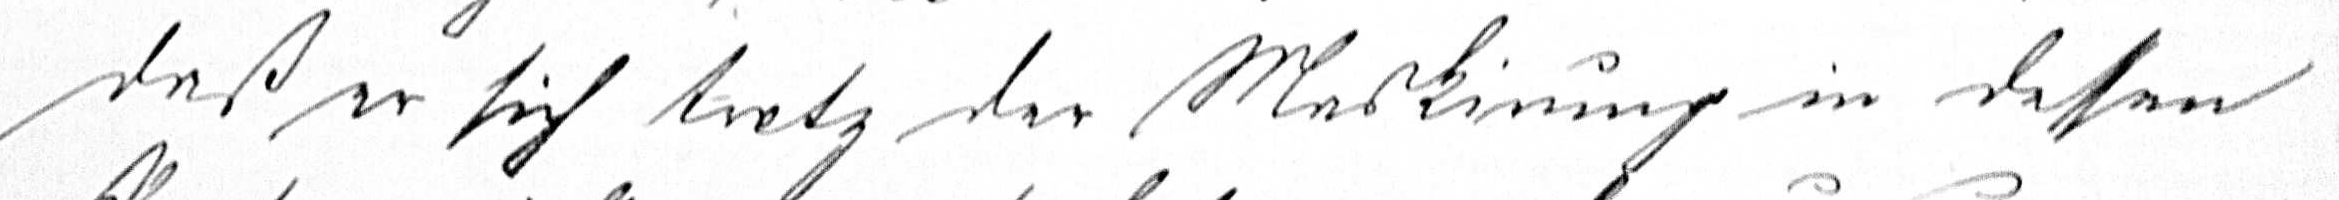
daß er sich trotz der Maskirung in dessen
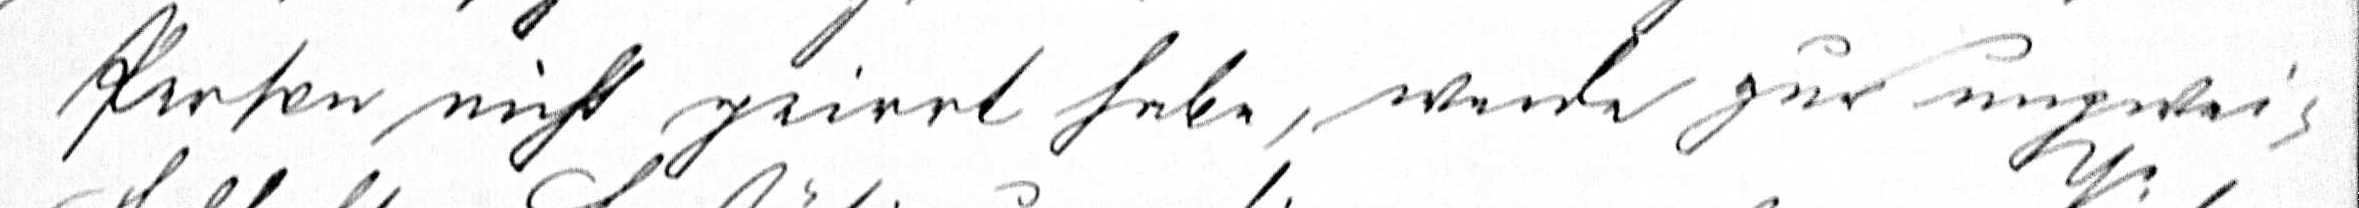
Person nicht geirrt habe, wurde zur unzwei¬
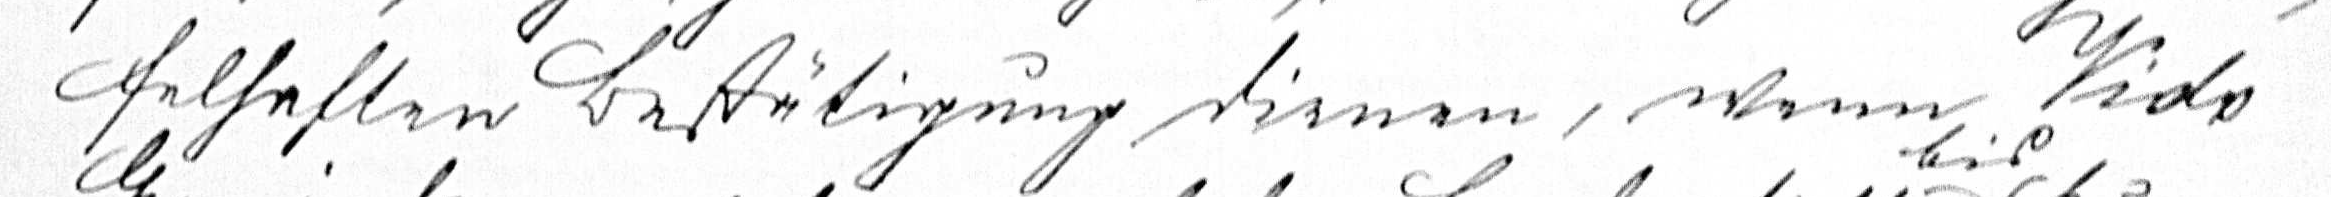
felhaften Bestätigung dienen, wenn Vido
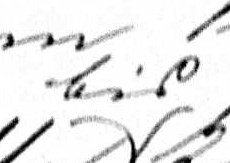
bis
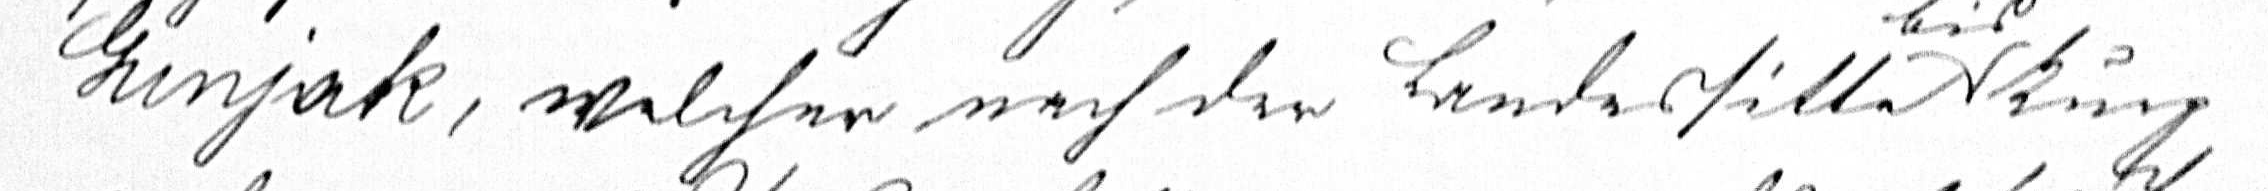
Gunjak, welcher nach der Landessitte kurz
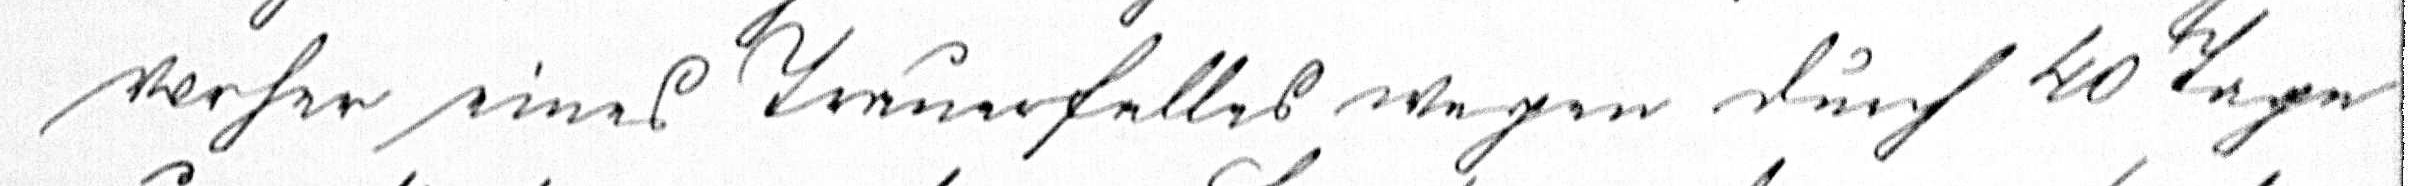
vorher eines Trauerfalles wegen durch 40 Tagen
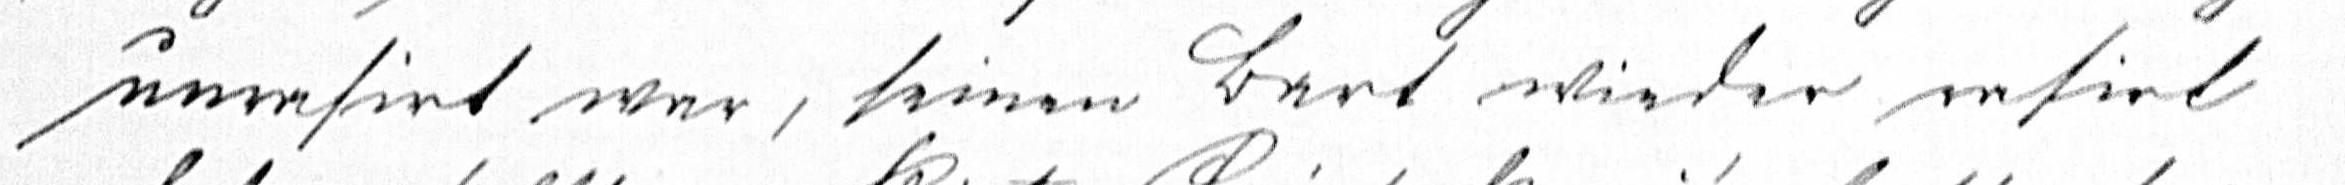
unrasirt war, seinen Bart wieder rasirt
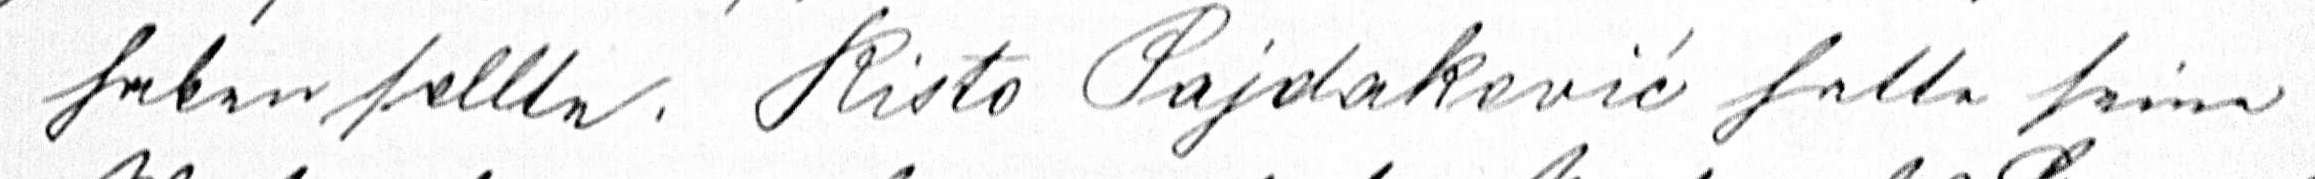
haben sollte. Risto Pajdaković hatte seine
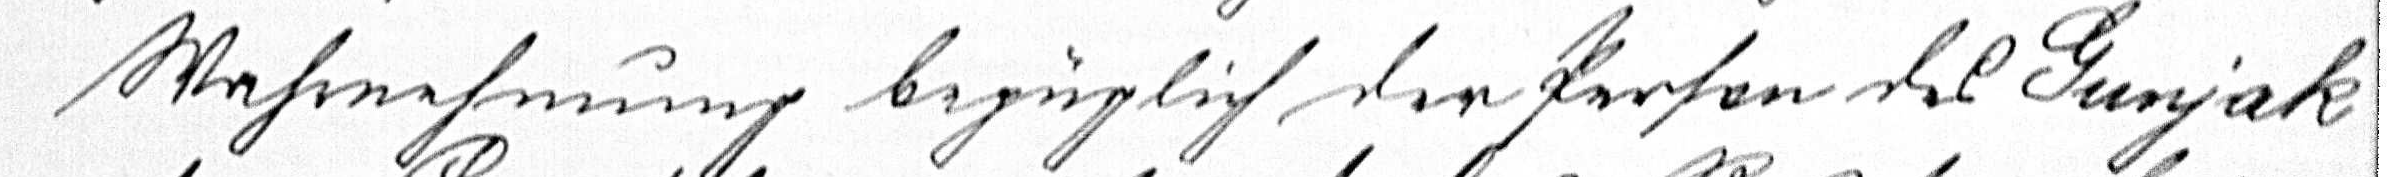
Wahrnehmung bezüglich der Person des Gunjak
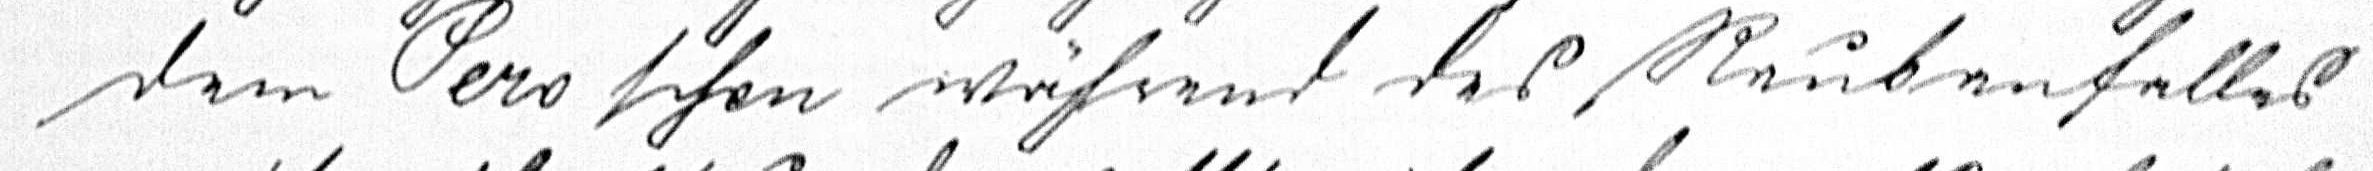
dem Pero schon während des Raubanfalles
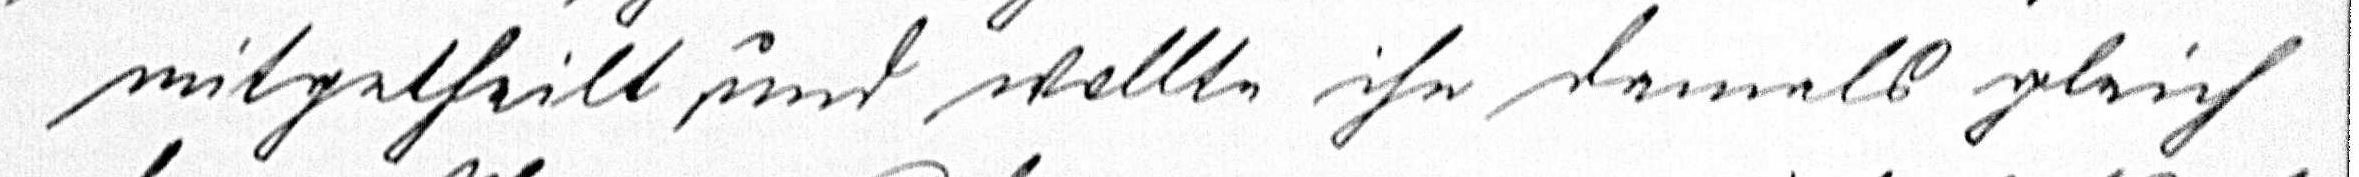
mitgetheilt und wollte ihn damals gleich
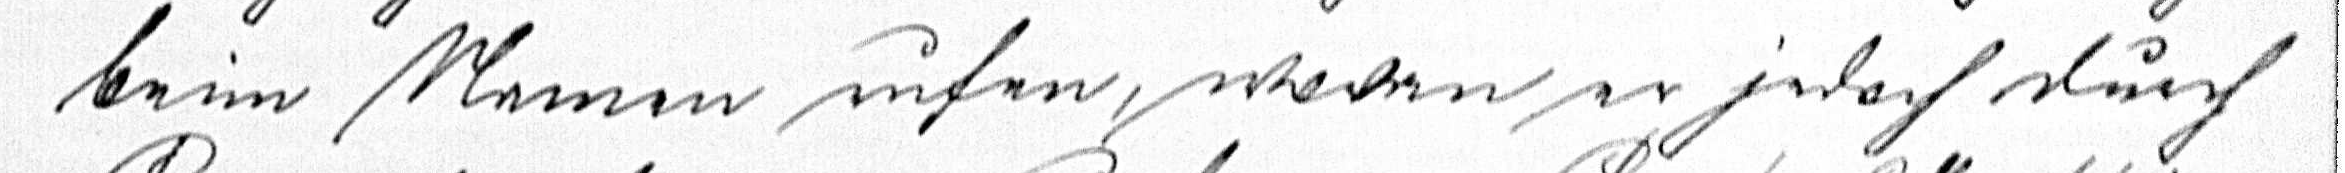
beim Namen rufen, wovon er jedoch durch
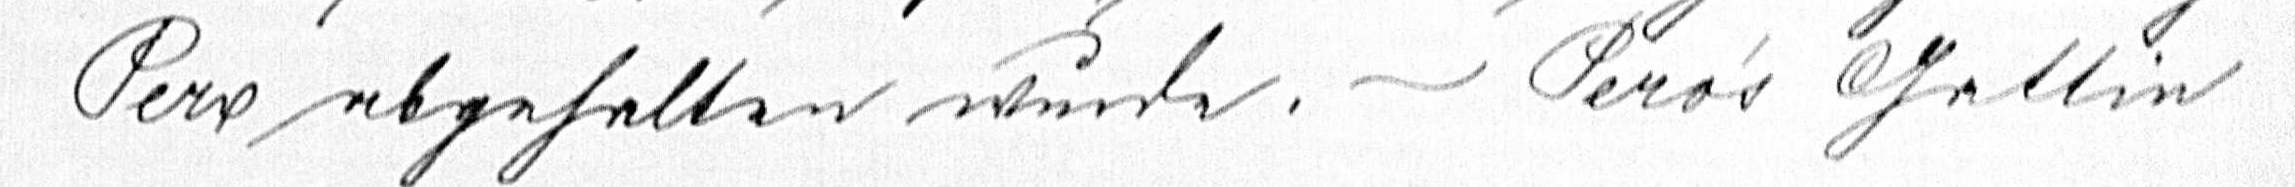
Pero abgehalten wurde. Pero’s Gattin
